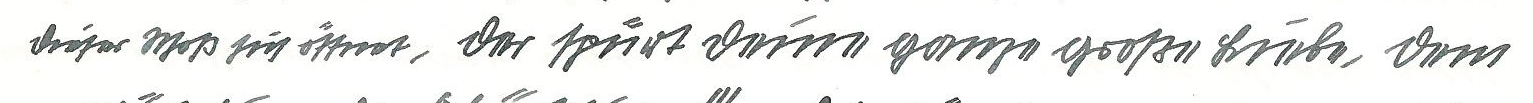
dieser Schoß sich öffnet, der spürt Deine ganze große Liebe, dem
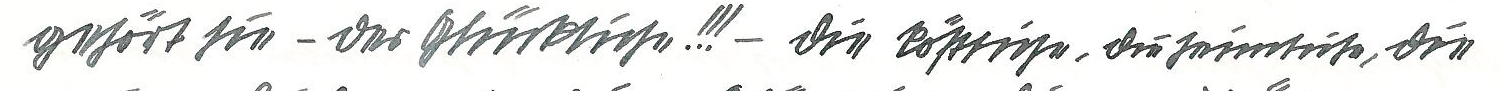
gehört sie – der Glückliche!!! – Die köstliche, die heimliche, die
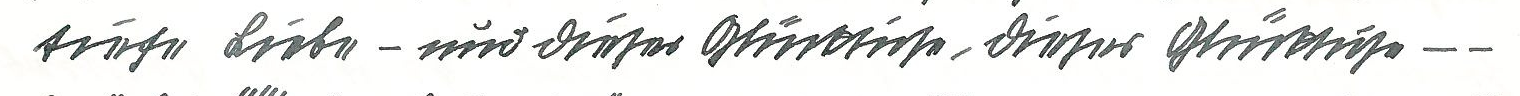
tiefe Liebe – und dieser Glückliche, dieser Glückliche – –
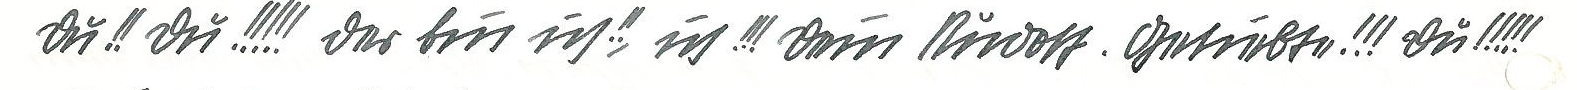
Du!! Du!!!!! – Der bin ich!!, ich!!! Dein. Geliebte!!! Du!!!!!
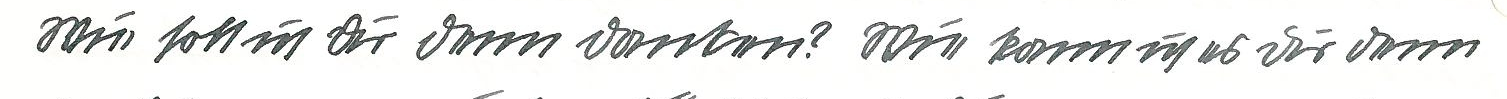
Wie soll ich Dir denn danken? Wie kann ich es Dir denn
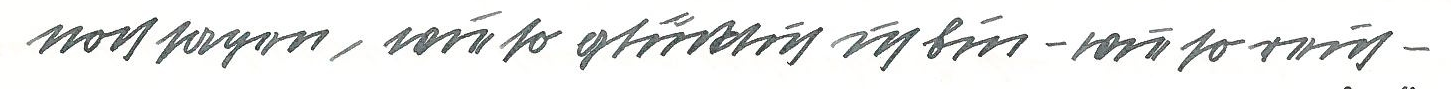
noch sagen, wie so glücklich ich bin – wie so reich –
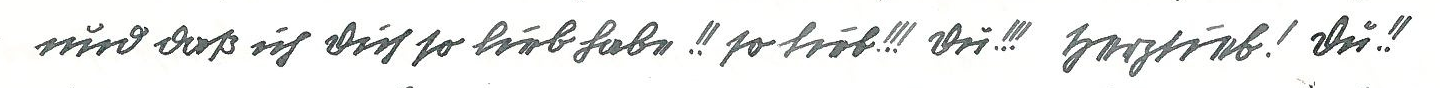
und daß ich Dich so lieb habe!! So lieb!!! Du!!! Herzlieb! Du!!
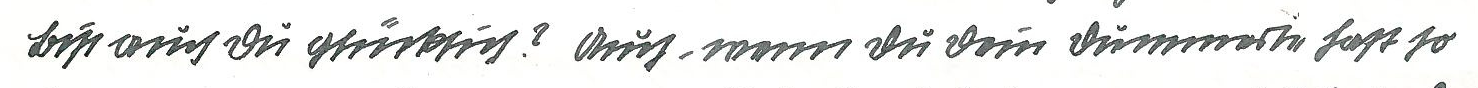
Bist auch Du glücklich? Auch, wenn Du Dein Dummerle hast so
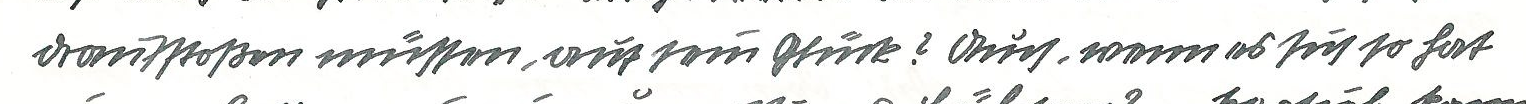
draufstoßen müssen, auf sein Glück? Auch, wenn es sich so hat
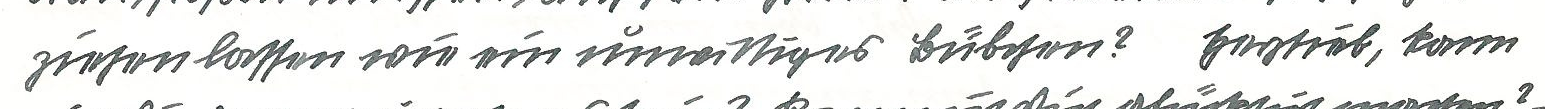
ziehen lassen wie ein unwilliges Bübchen? Herzlieb, kann
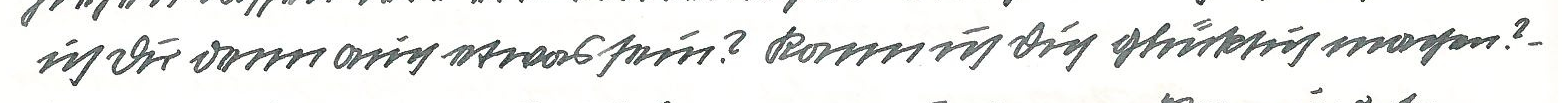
ich Dir denn auch etwas sein? Kann ich Dich glücklich machen? –
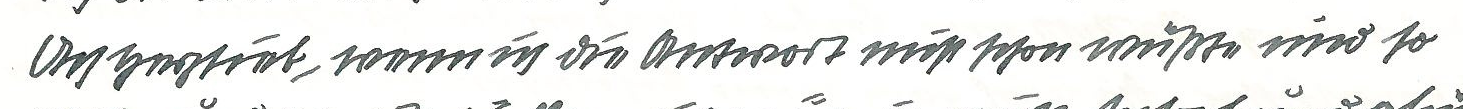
Ach Herzlieb, wenn ich die Antwort nicht schon wüßte und so
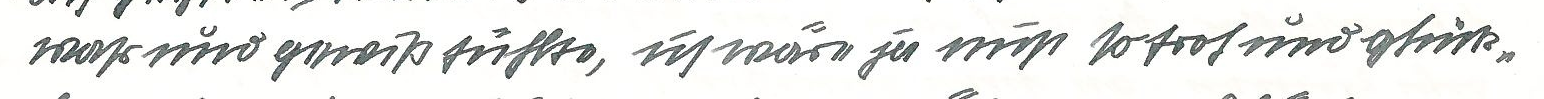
wahr und gewiß fühlte, ich wäre ja nicht so froh und glück¬
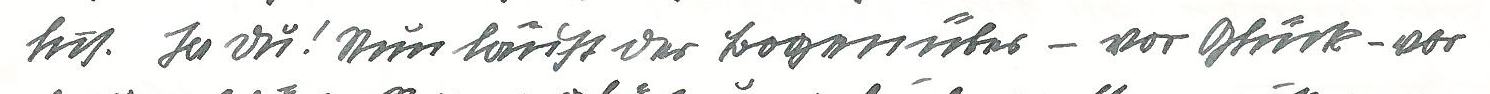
lich. Ja Du! Nun läuft der Bogen über – vor Glück – vor
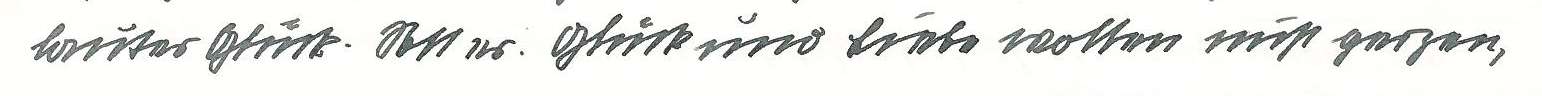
lauter Glück. Soll es. Glück und Liebe wollen nicht geizen,
